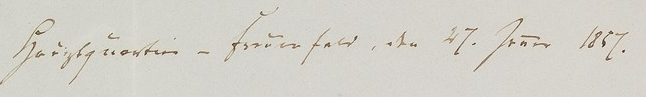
Hauptquartier – Frauenfeld, den 27. Jenner 1857.
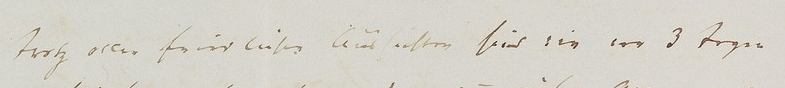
Trotz aller friedlichen Aussichten sind wir vor 3 Tagen
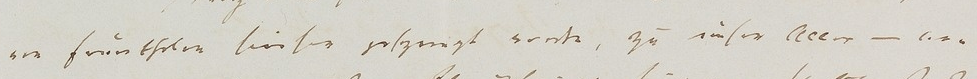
von Feuerthalen hieher gesprengt worden, zu unser Aller – na-
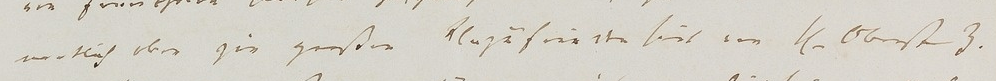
mentlich aber zur großen Unzufriedenheit von H. Oberst Z.
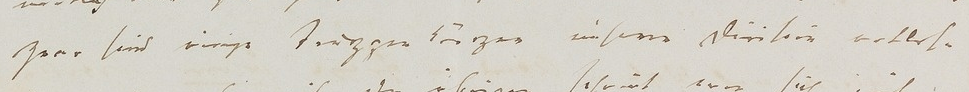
Zwar sind einige Truppenkörper unserer Division entlas-
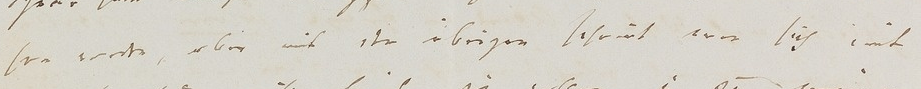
sen worden, aber mit den übrigen scheint man sich mit
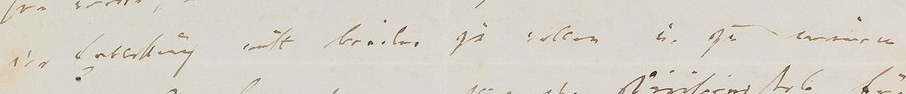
der Entlassung nicht beeilen zu wollen u. zu meinem
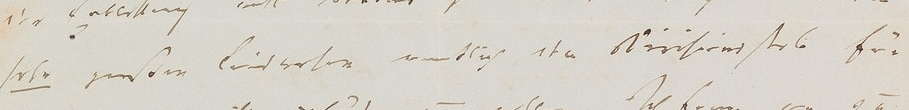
sehr großen Leidwesen namentlich den Divisionsstab für
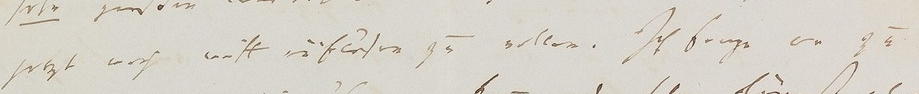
jetzt noch nicht auflösen zu wollen. Ich fange an zu
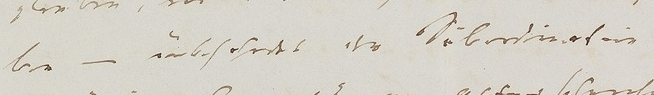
ben – unbeschadet der Subordination –
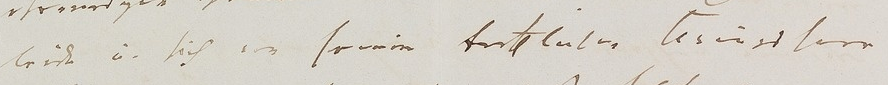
leide u. sich von seinem trefflichen Kriegsheer
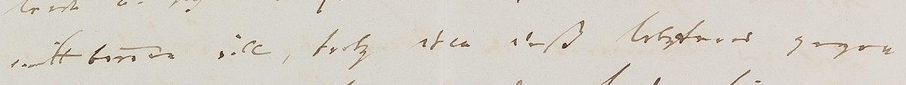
nicht trennen will, trotz dem daß letzteres gegen
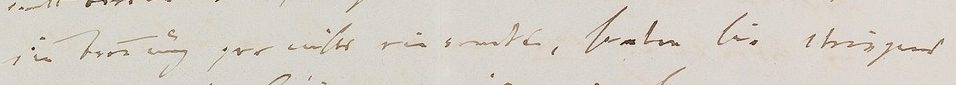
die Trennung gar nichts einwandte, sondern sie dringend
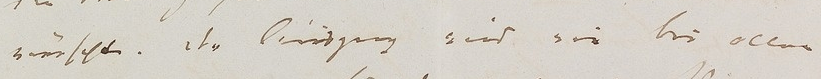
wünschte. Der Ausgang wird wie bei allen
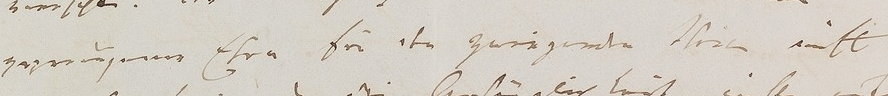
gezwungenen Ehen für den zwingenden Theil nicht
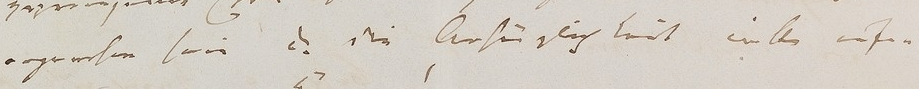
angenehm sein u. die Anhänglichkeit nicht auf-
